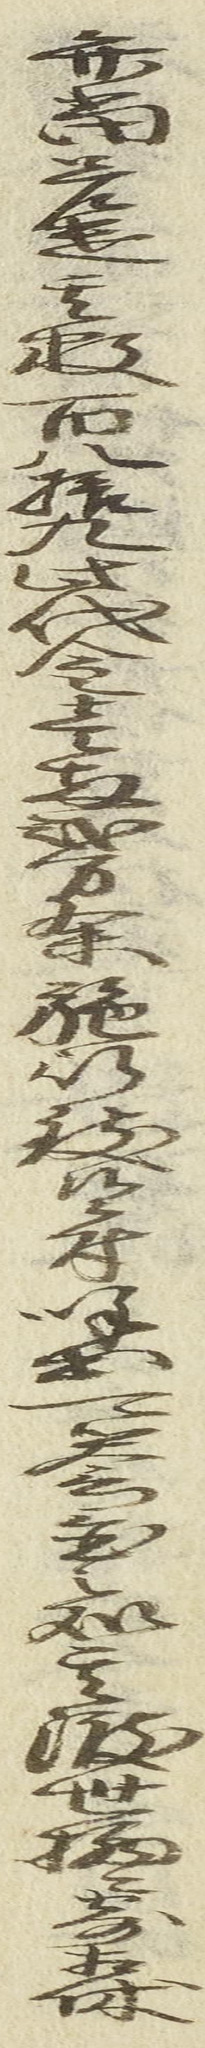弁当差遣其数百八拾九此代金壱両弐分余施行致候ニ付呼出可誉置之処渡世柄ニ寄相休
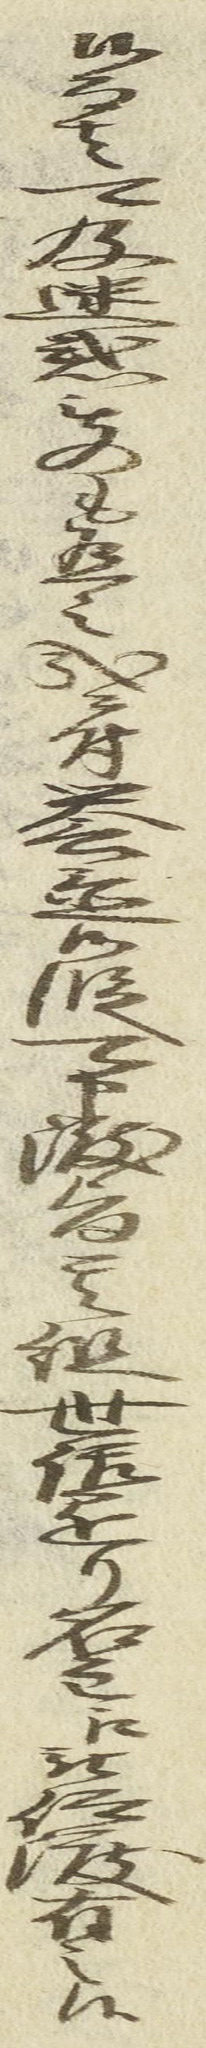候而者可及迷惑ものも有之哉ニ付誉置候段可申渡旨其組世話懸り名主江被仰渡有之候
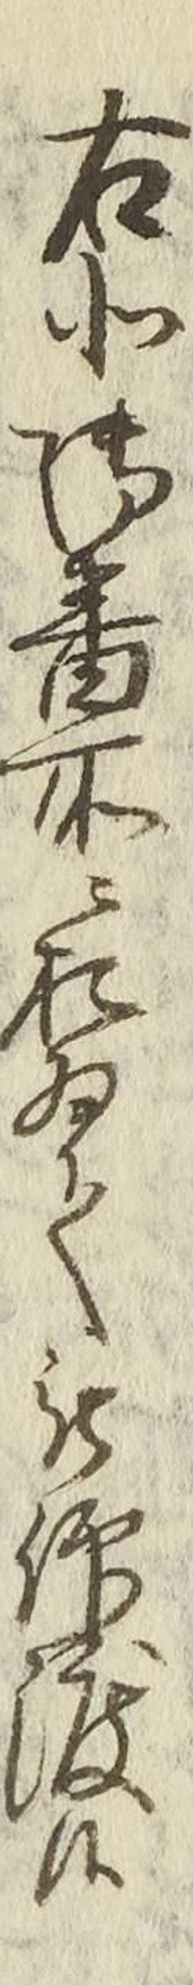右北御番所ニ於ゐて被仰渡候
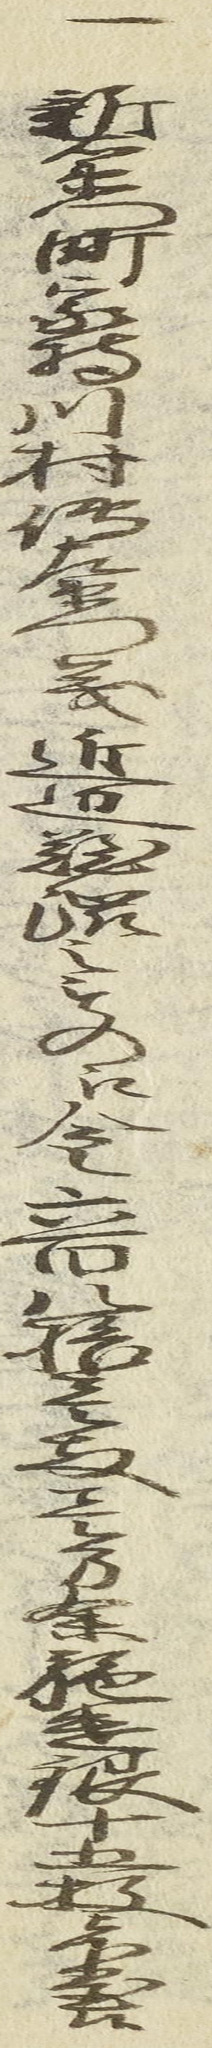一新右衛門町家持川村伝左衛門義近辺難渋之もの江金六百八拾壱両壱分余施遣銀十五枚被下置候
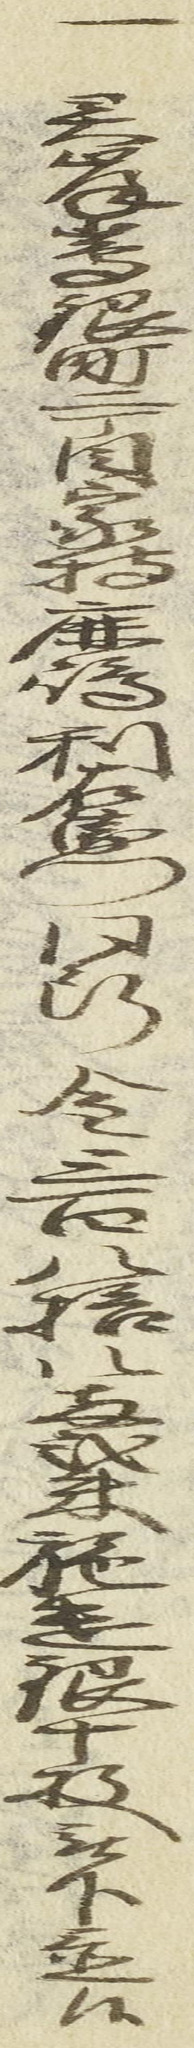一霊岸嶌銀町二丁目家持鹿嶋利右衛門同断金三百八拾八両弐朱施遣銀十枚被下置候
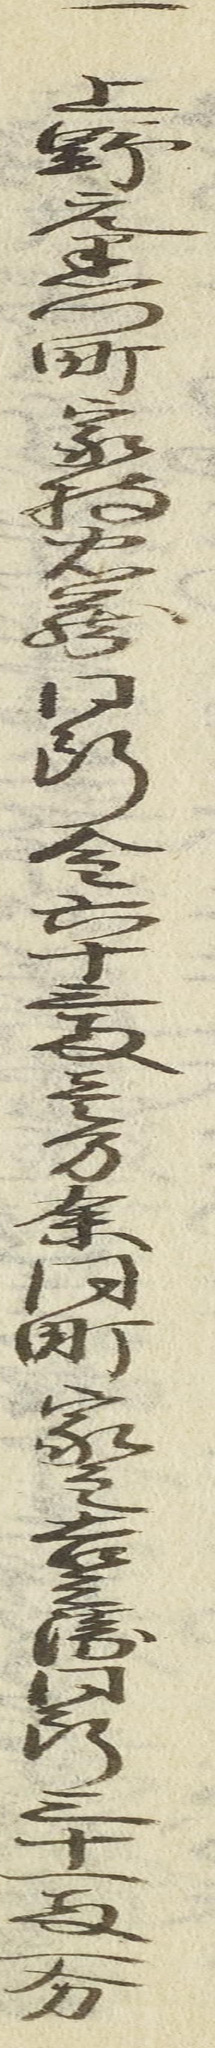一上野元黒門町家持忠蔵同断金六十三両壱分余同町家主吉兵衛同断三十一両一分
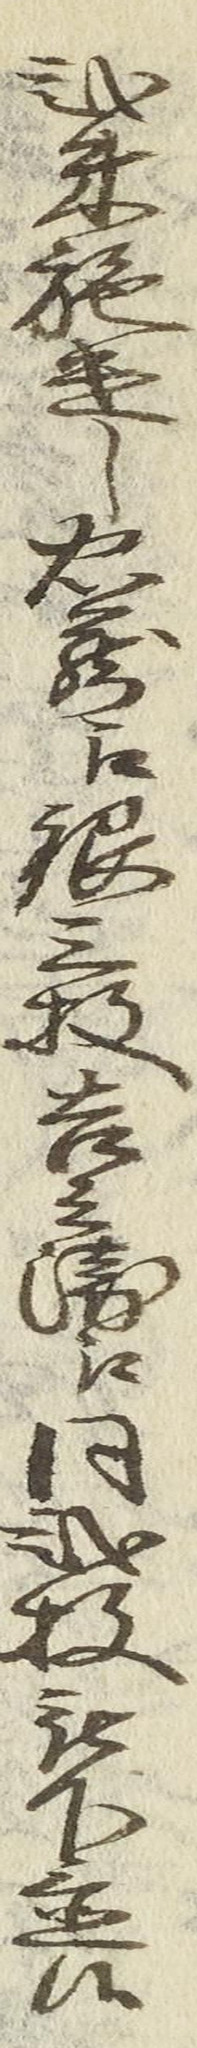弐朱施遣し忠蔵江銀三枚吉兵衛江同弐枚被下置候
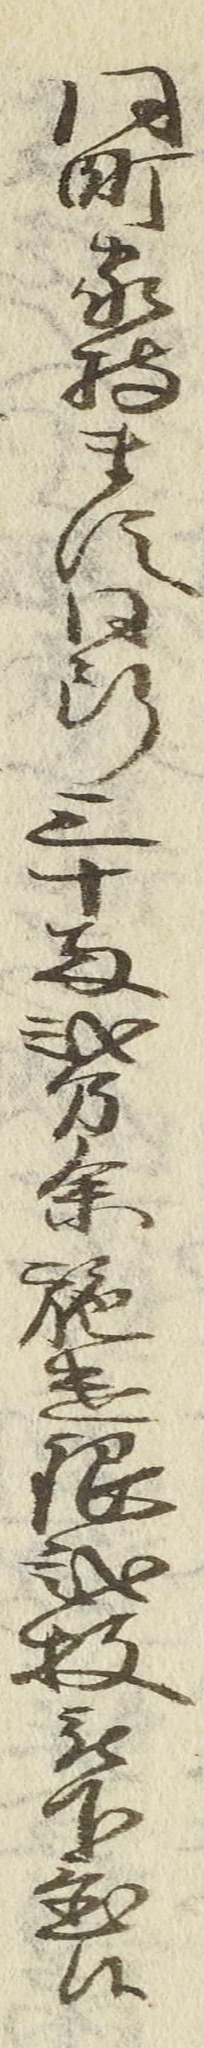一同町家持ます同断三十両弐分余施遣銀弐枚被下置候
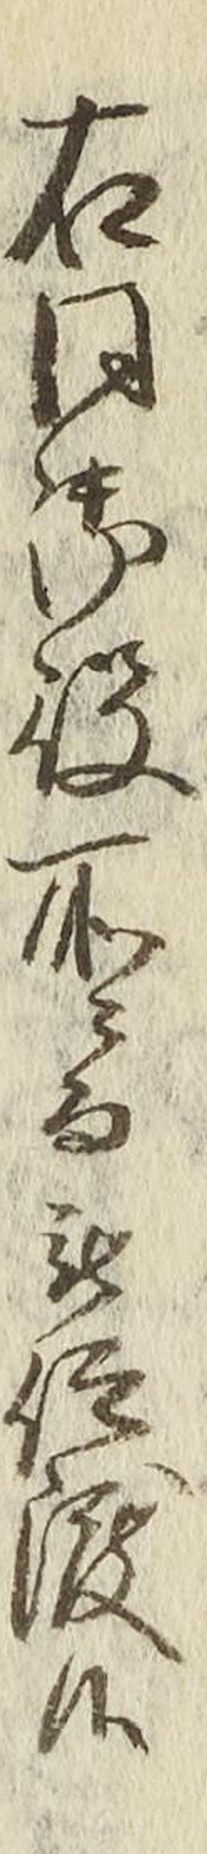右同御役所二而被仰渡候
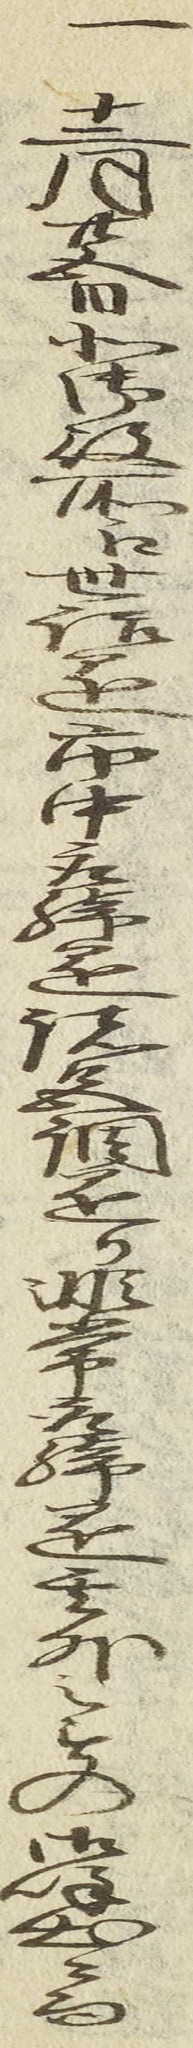一十二月廿五日北御役所江世話懸市中取締懸諸色調懸り非常取締懸其外之もの御呼出二而
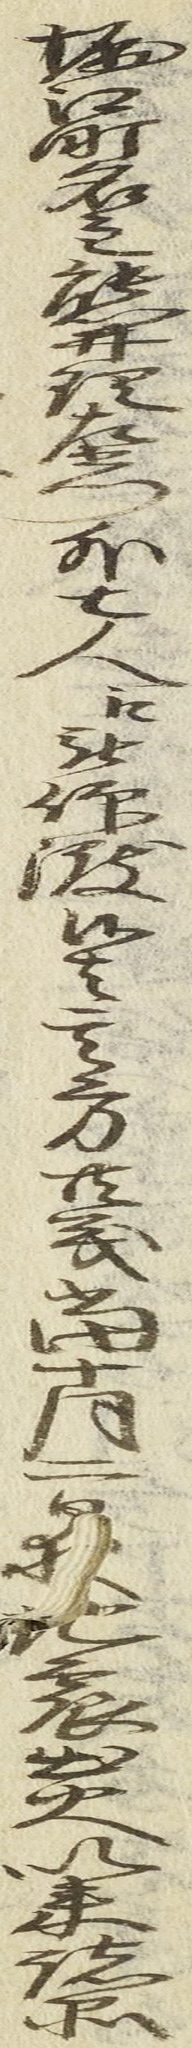堀江町名主熊井理左衛門外七人江被仰渡候者其方共義当十月二日夜地震出火以来諸品
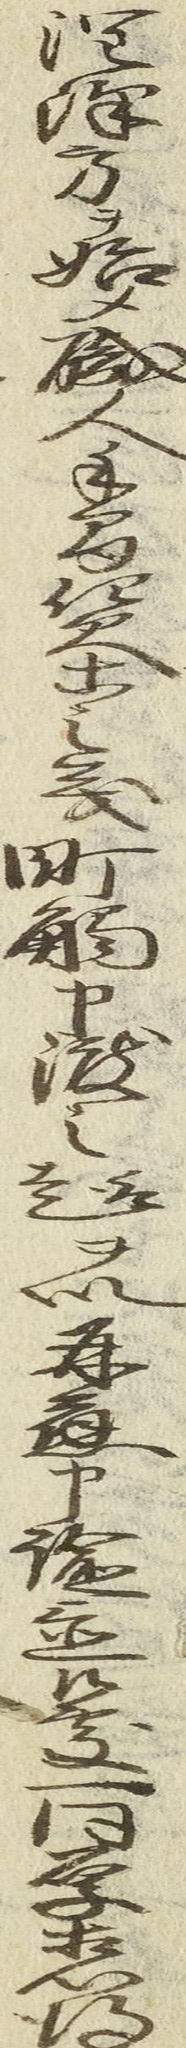潤沢方ヲ始メ職人手間賃等之義町触申渡之趣ヲ以再応申諭置候処一同厚相心得
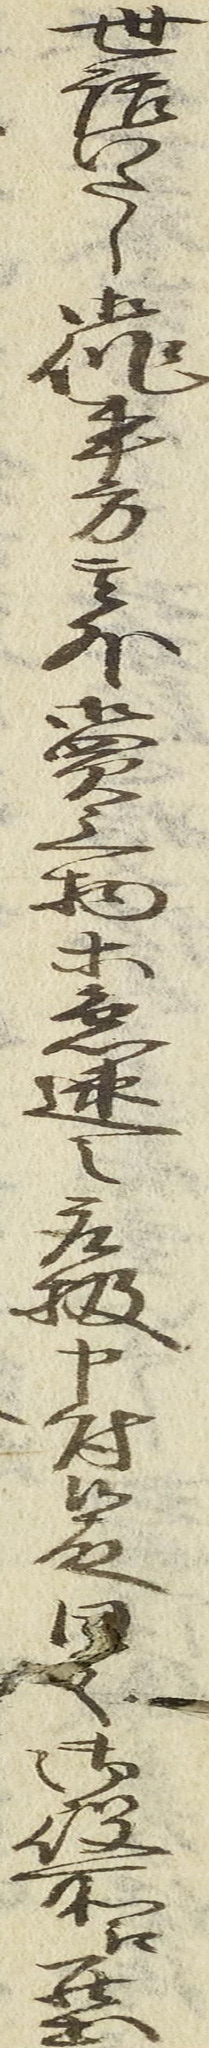世話いたし御作事方其外御買上物等急速之取扱申付候故同じ御役所江罷出
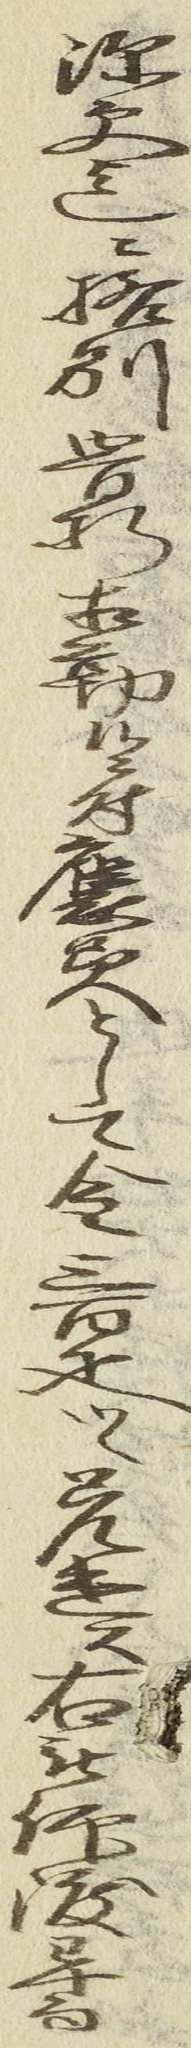深更迄ニ格別骨折相勤候ニ付褒美として金三百疋ツヽ差遣ス右被仰渡畢而
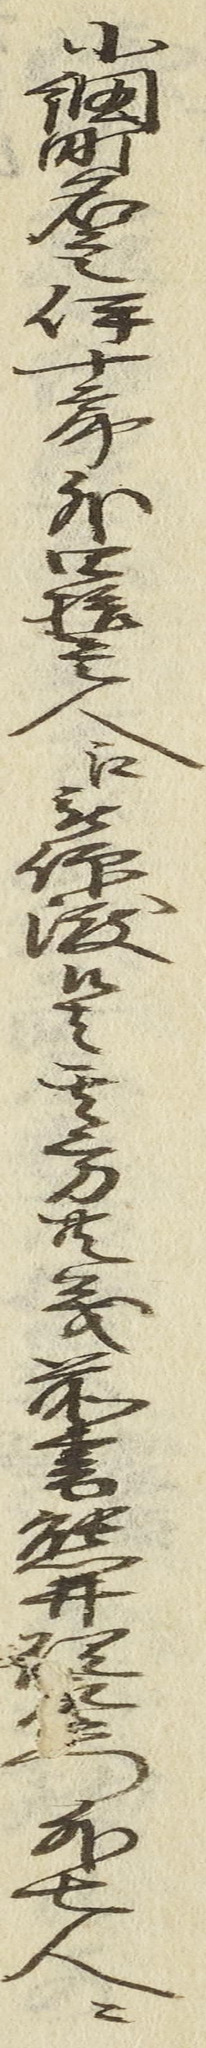小網町名主伊十郎外四拾壱人江被仰渡候者其方共義前書熊井理左衛門外七人ニ
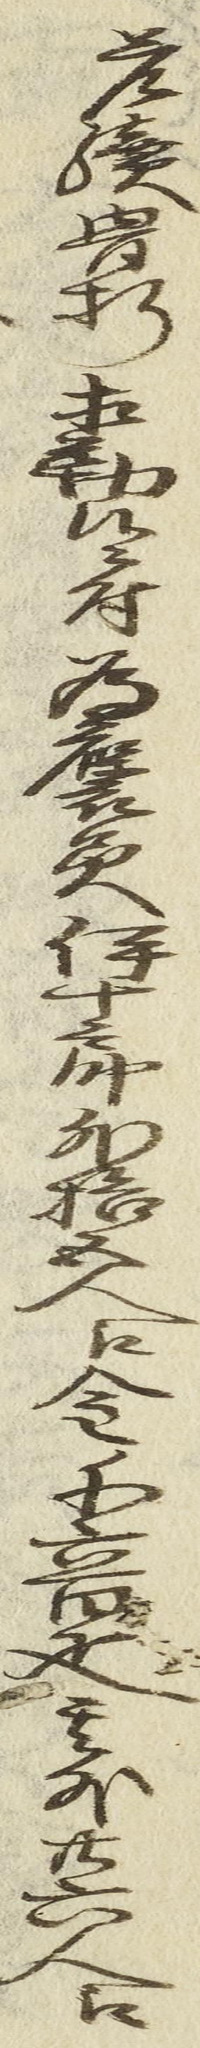差続骨折相勤候ニ付為褒美伊十郎外拾五人江金千六百疋其外廿六人江
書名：安政二年震災記事　完
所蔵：東京大学地震研究所図書室 Earthquake Research Institute Library, The University of Tokyo, JAPAN
